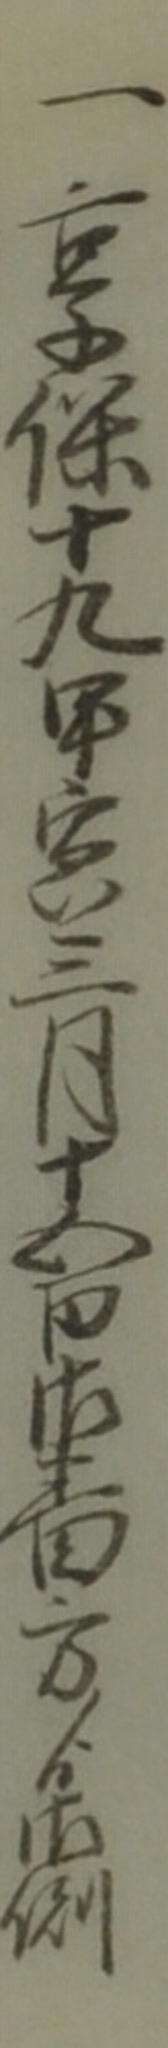一享保十九甲寅三月十五日御番方ゟ御側
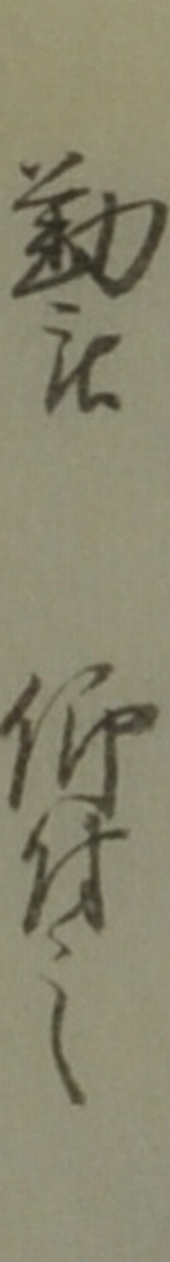勤被仰付之
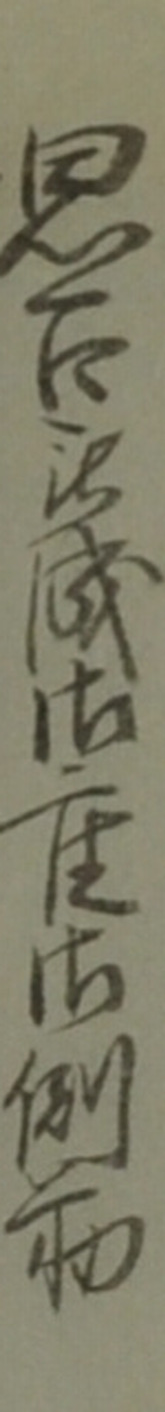思召被成御座御側勤
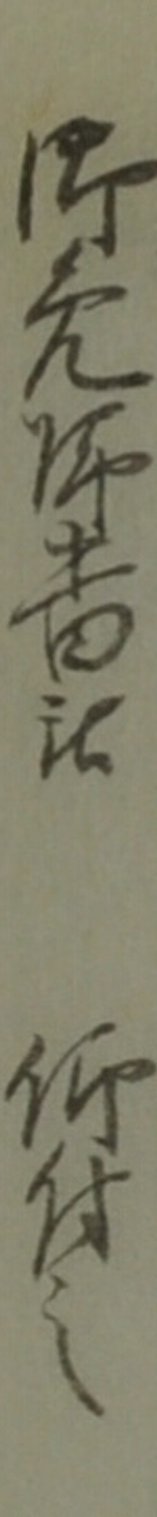御免帰番被仰付之
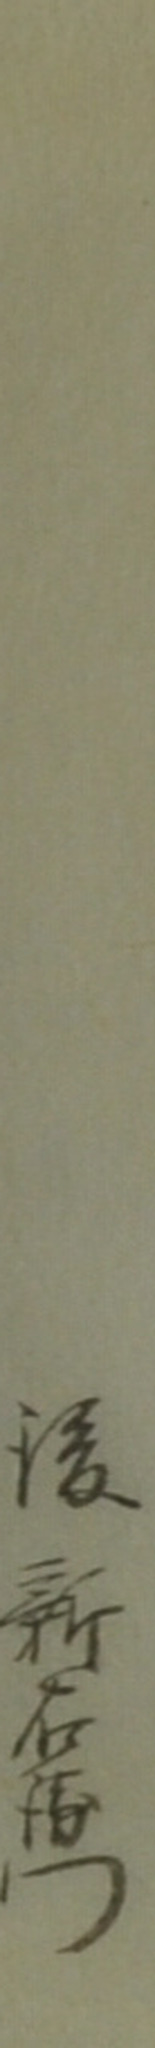後新右衛門
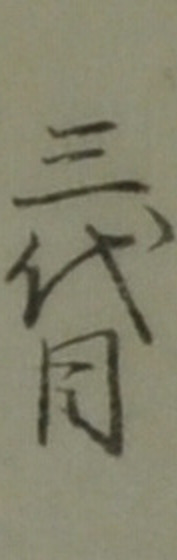三代目
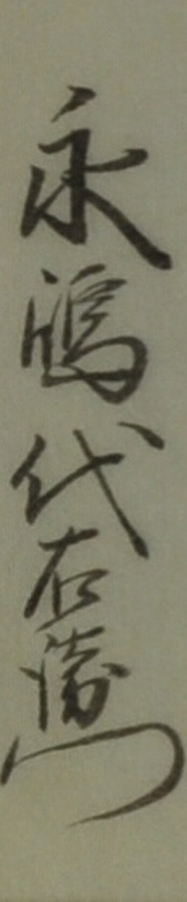永嶋代右衛門
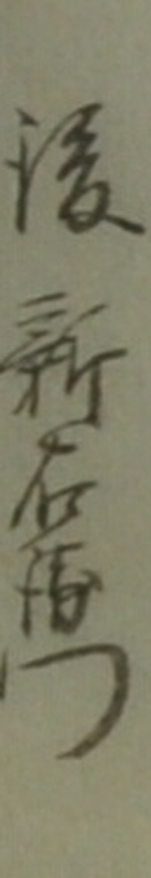後新右衛門
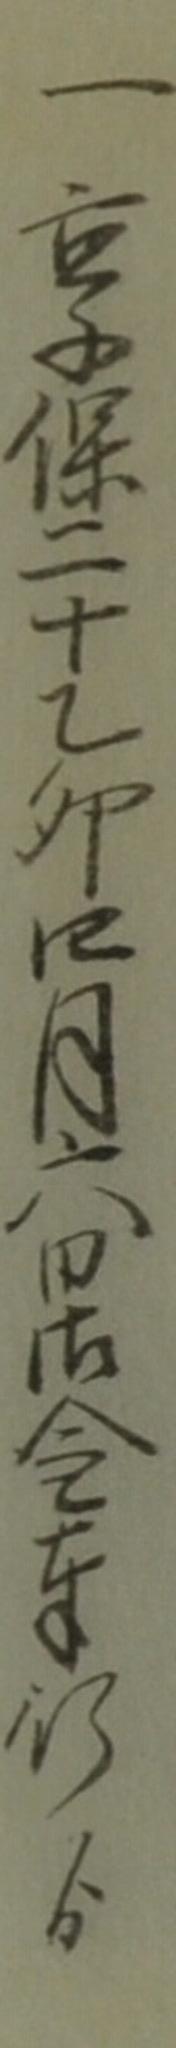一享保二十乙卯四月六日御金奉行ゟ
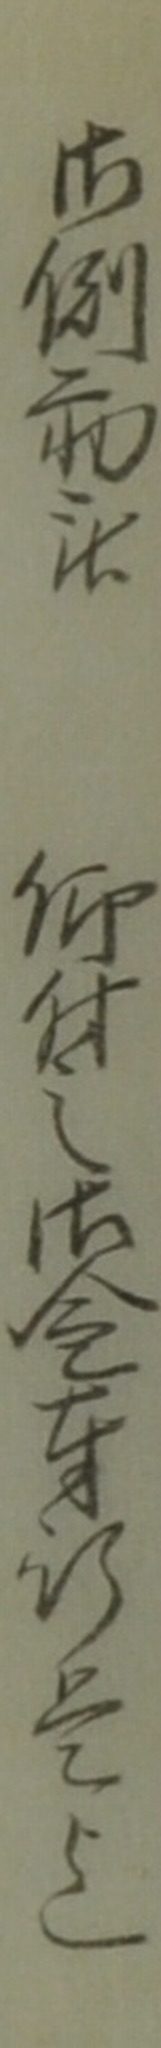御側勤被仰付之御金奉行是迄
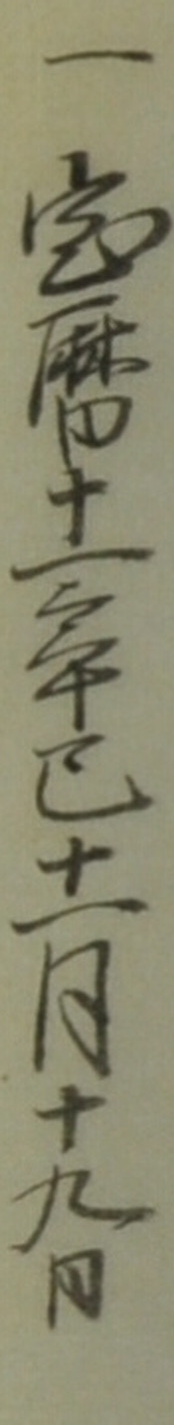一宝暦十一辛巳十一月十九日

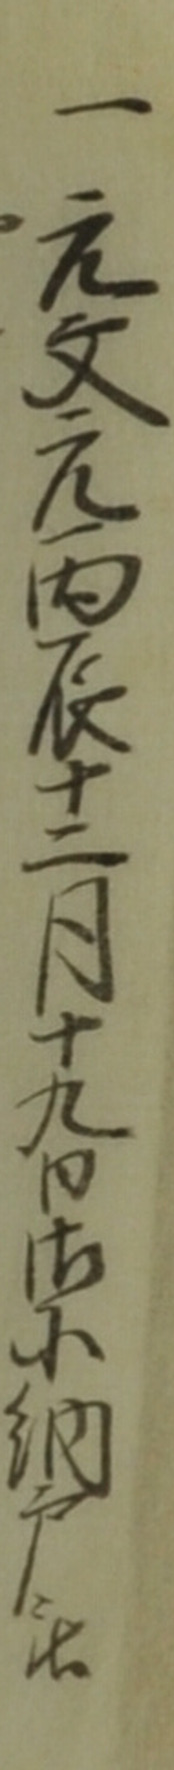一元文元丙辰十二月十九日御小納戸被
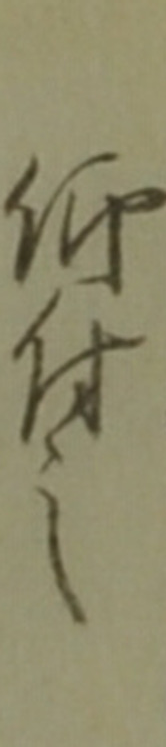仰付之
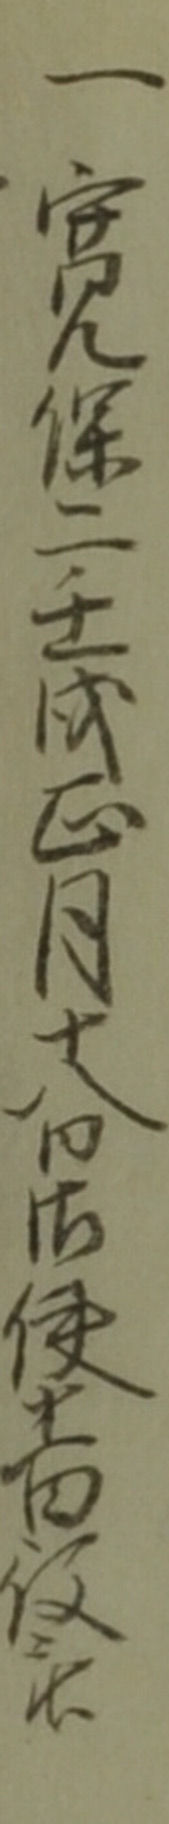一寛保二壬戌正月十八日御使番役被
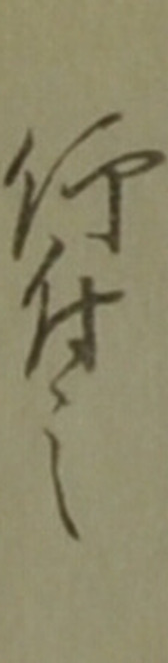仰付之
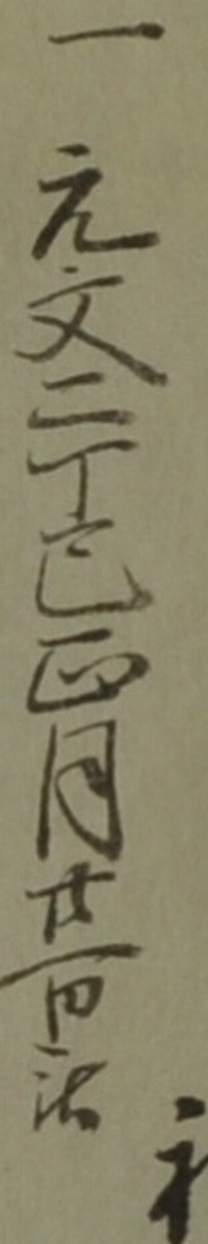一元文二丁巳正月廿一日被
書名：諸御役代々録（五）
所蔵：伊那市立高遠町図書館・合同会社AMANE
